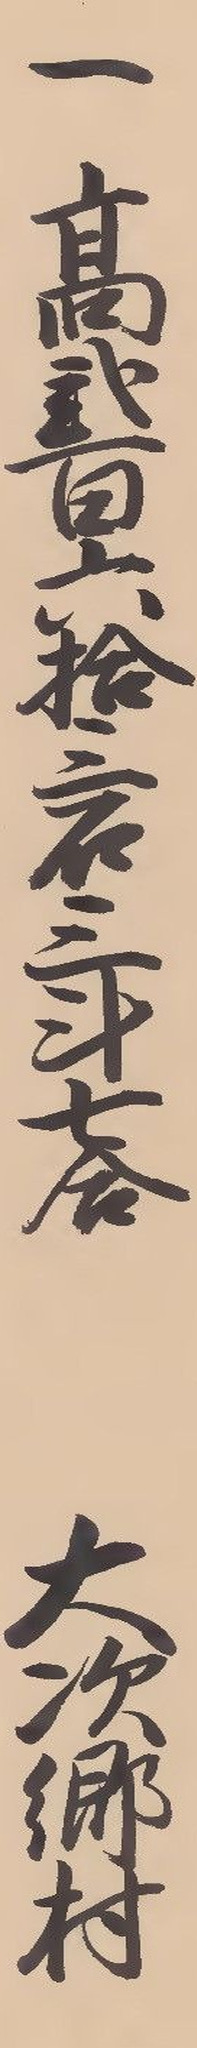一高弐百六拾三石三斗七合大次郷村
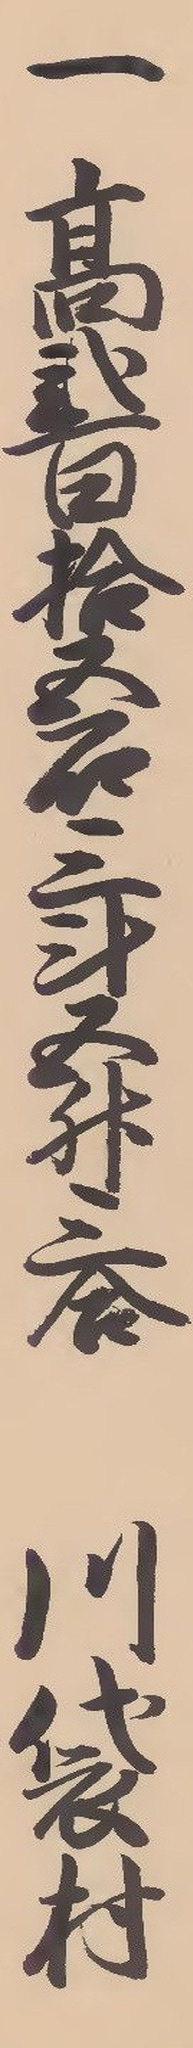一高弐百拾五石三斗五升三合川袋村

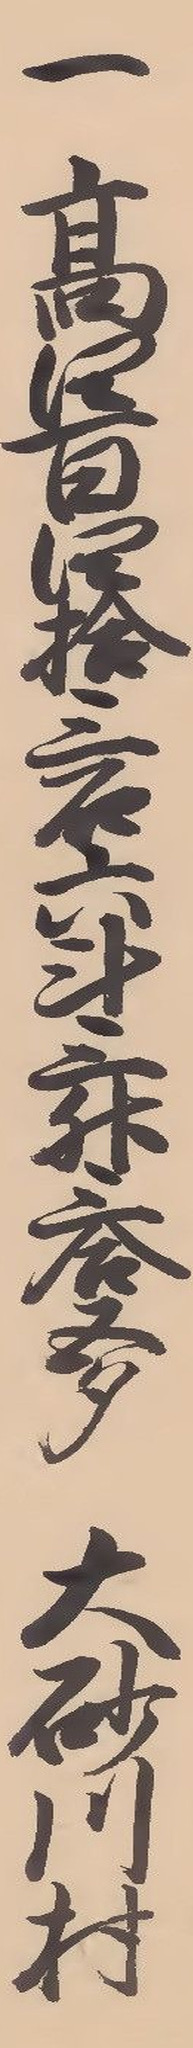一高四百四拾三石六斗三升三合五勺大砂川村
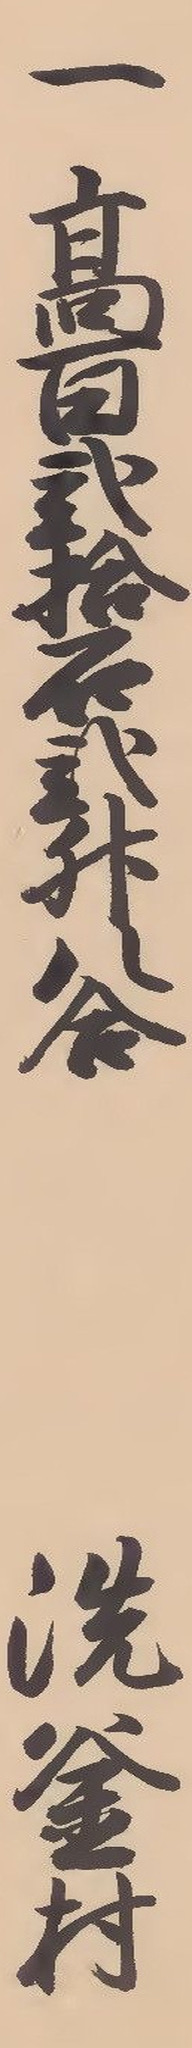一高百弐拾石弐升八合洗釜村
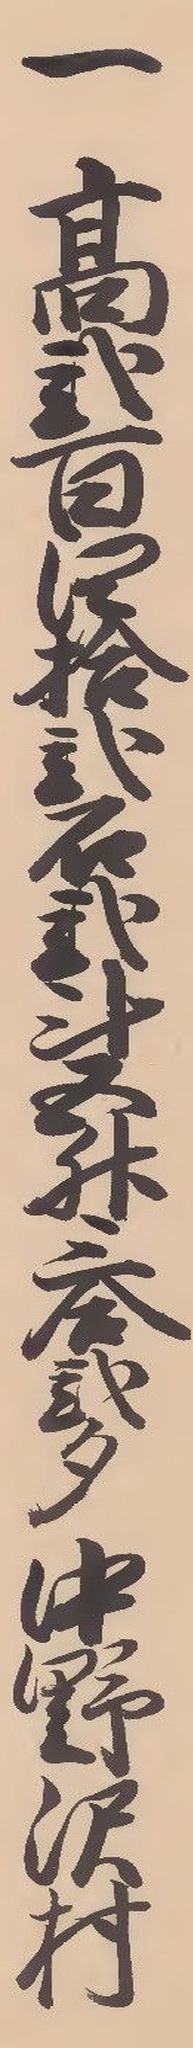一高弐百四拾弐石弐斗五升三合弐勺中野沢村
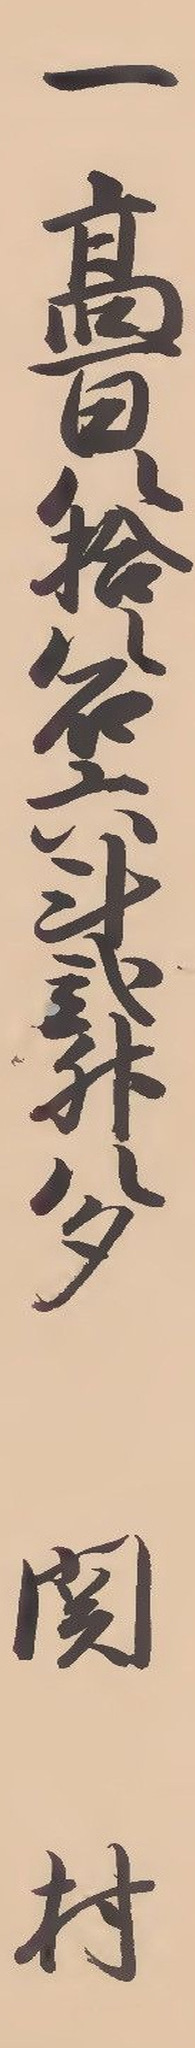一高百八拾八石六斗弐升八勺関村
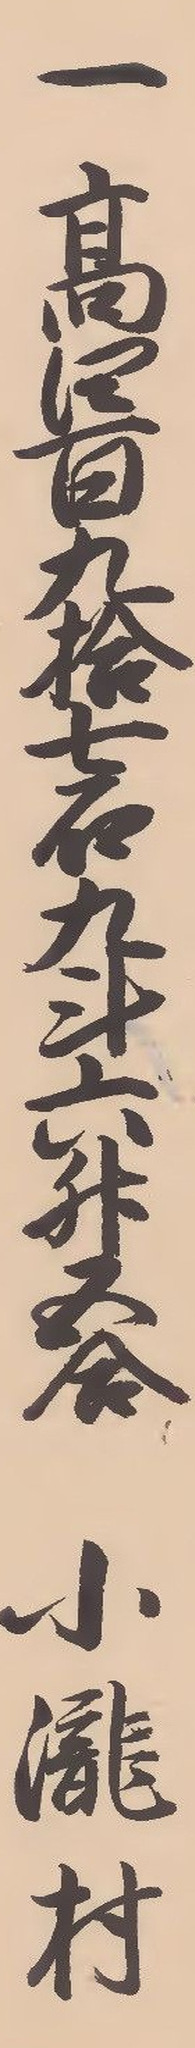一高四百九拾七石九斗六升五合小滝村
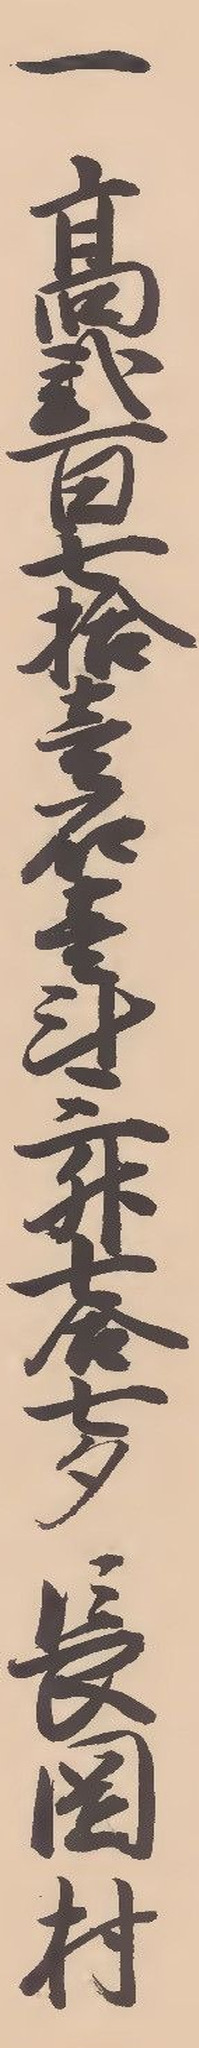一高弐百七拾壱石壱斗三升七合七勺長岡村
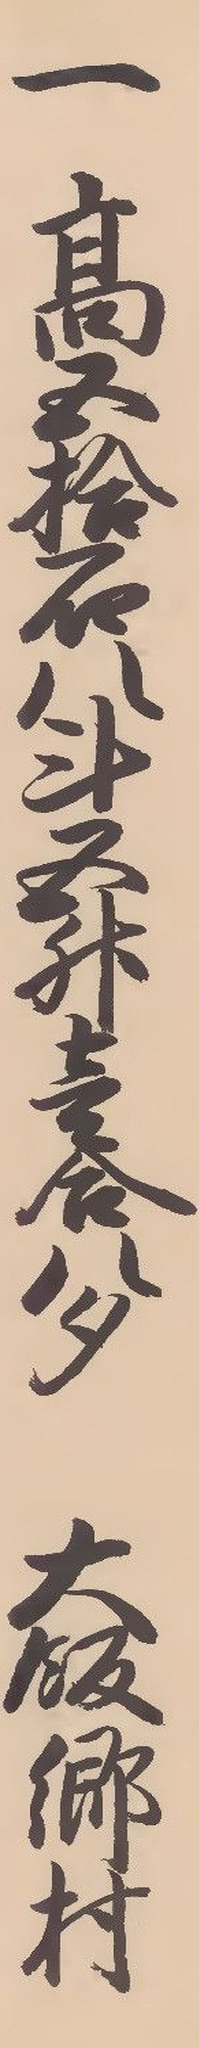一高五拾石八斗五升壱合八勺大飯郷村
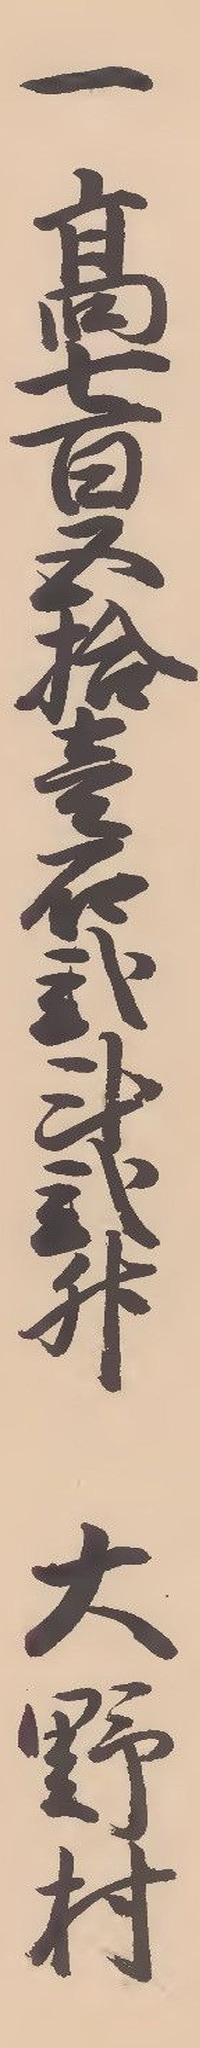一高七百五拾壱石弐斗弐升大野村

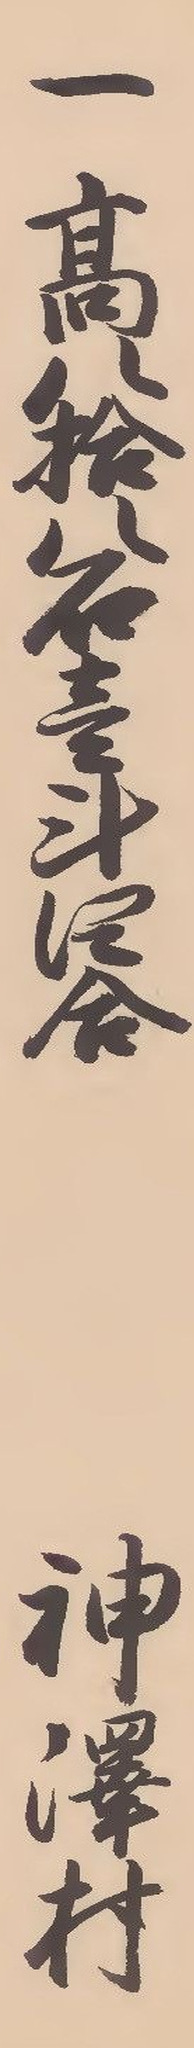一高八拾石壱斗四合神沢村
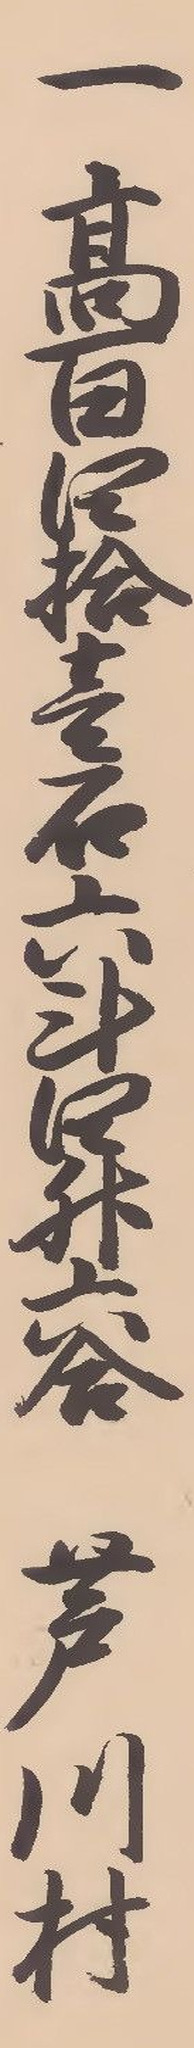一高百四拾壱石六斗四升六合芦川村
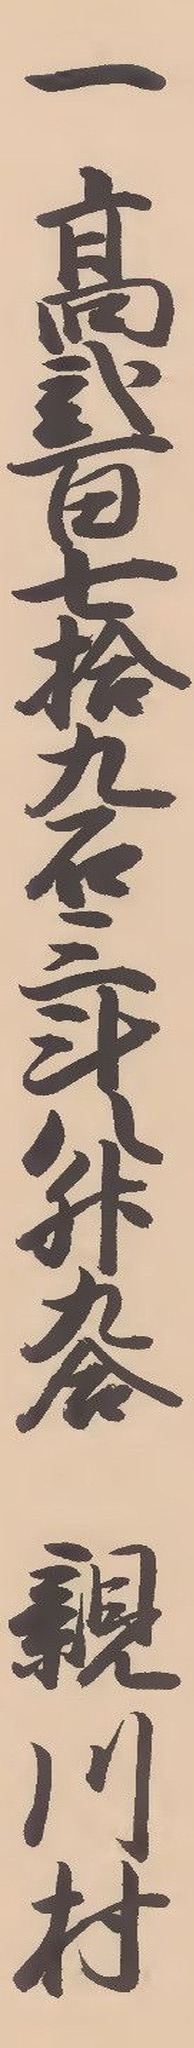一高弐百七拾九石三斗八升九合親川村
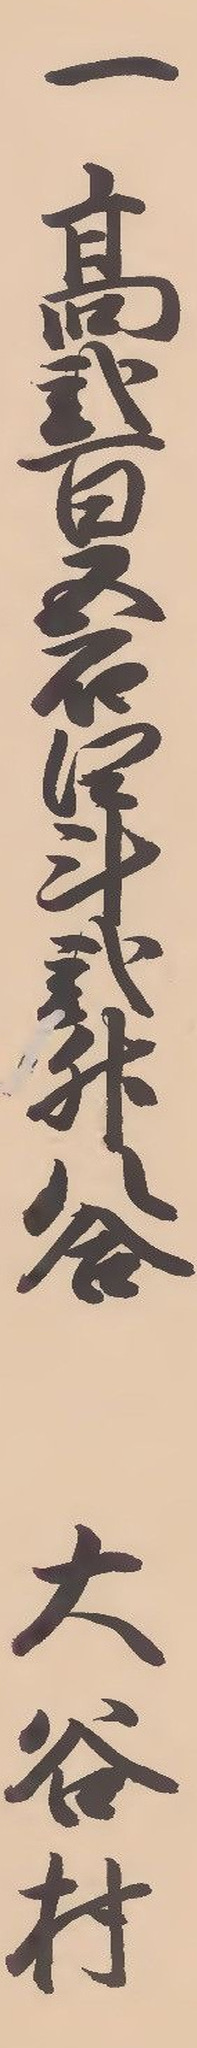一高弐百五石四斗弐升八合大谷村
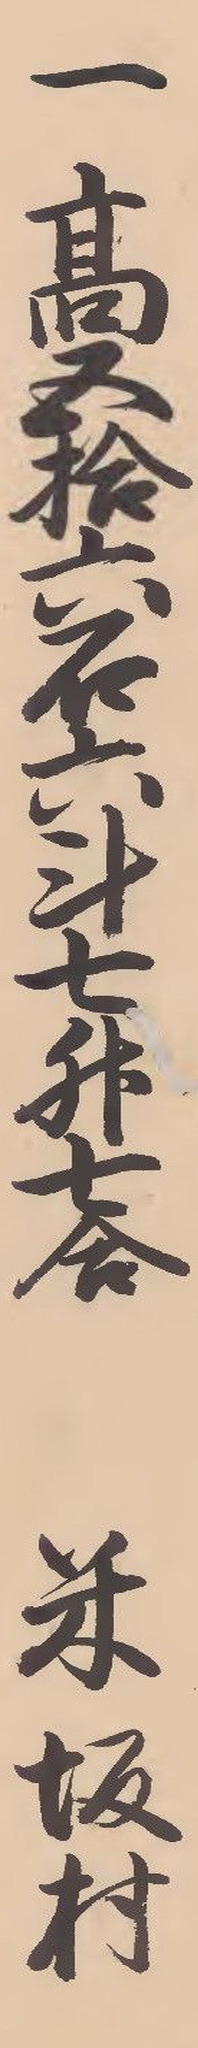一高五拾六石六斗七升七合米坂村
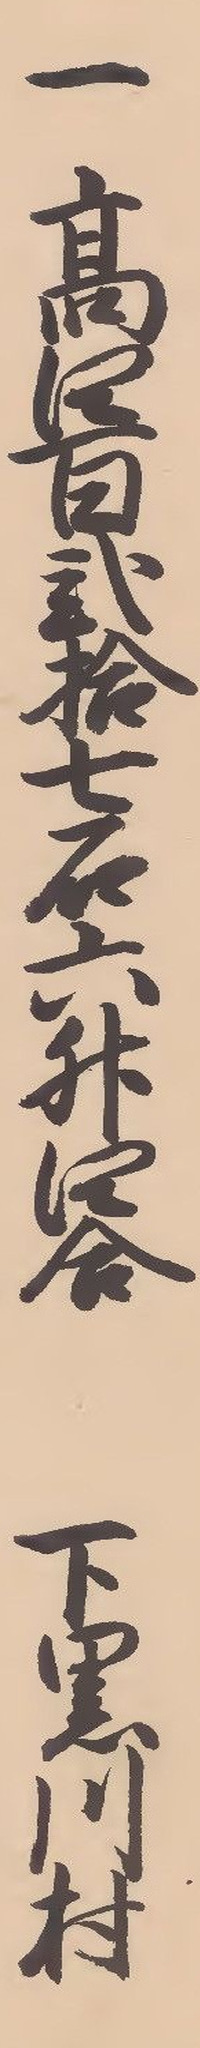一高四百弐拾七石六升四合下黒川村
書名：出羽国郷帳　５
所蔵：国立公文書館 National Archives of Japan
